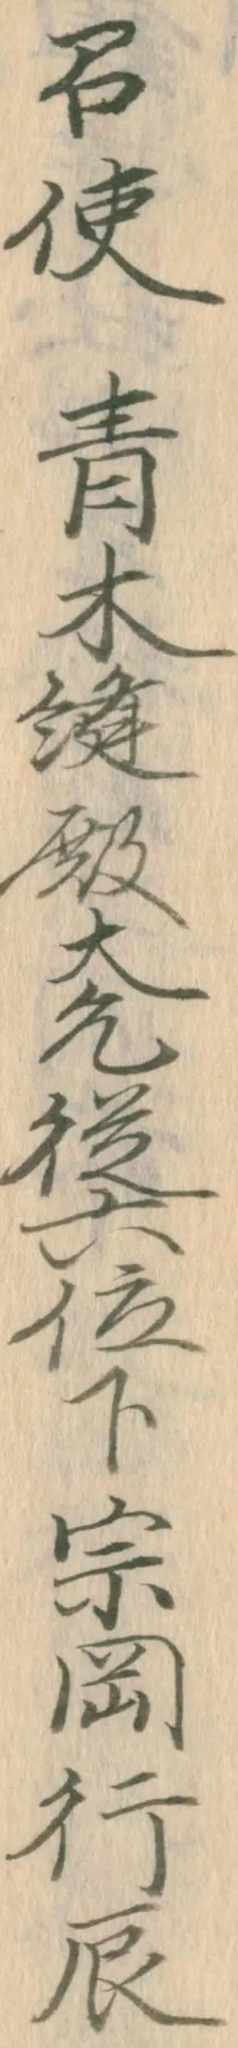召使青木縫殿大允従六位下宗岡行辰
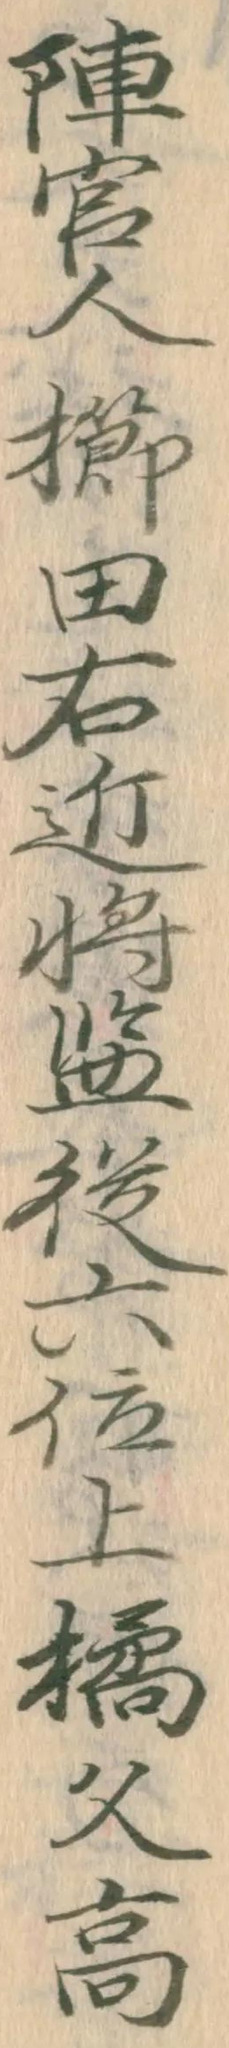陣宮人櫛田右近将監従六位上橘久高
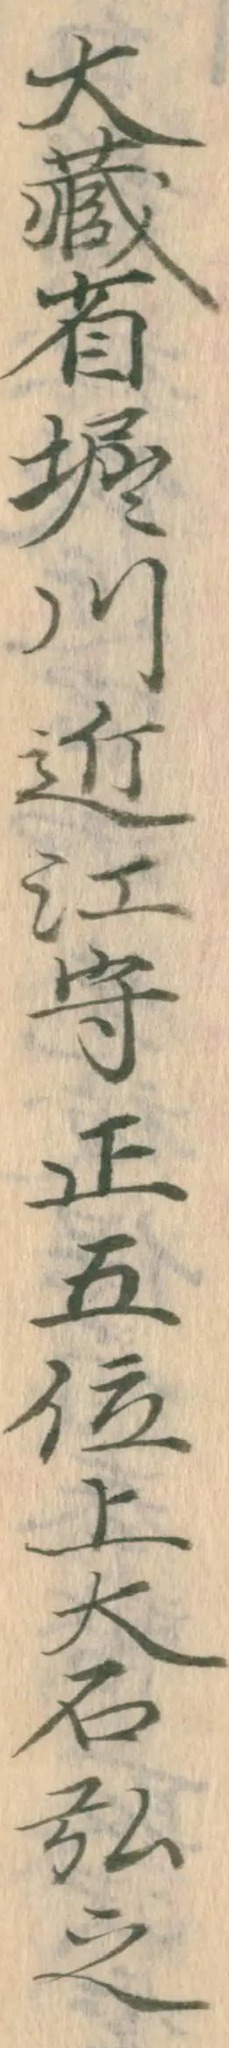大蔵省堀川近江守正五位上大石弘之
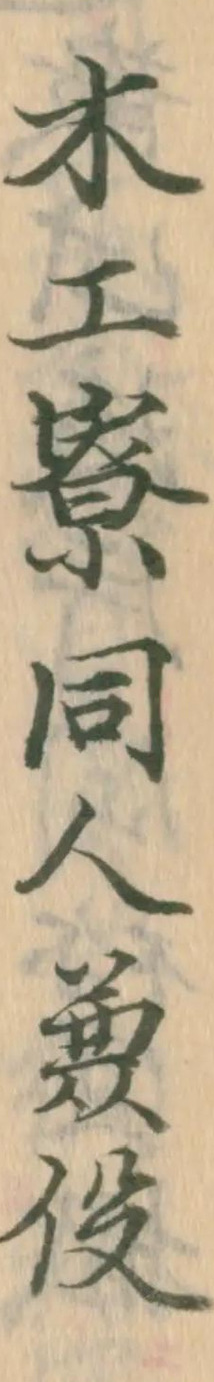木工寮同人兼役
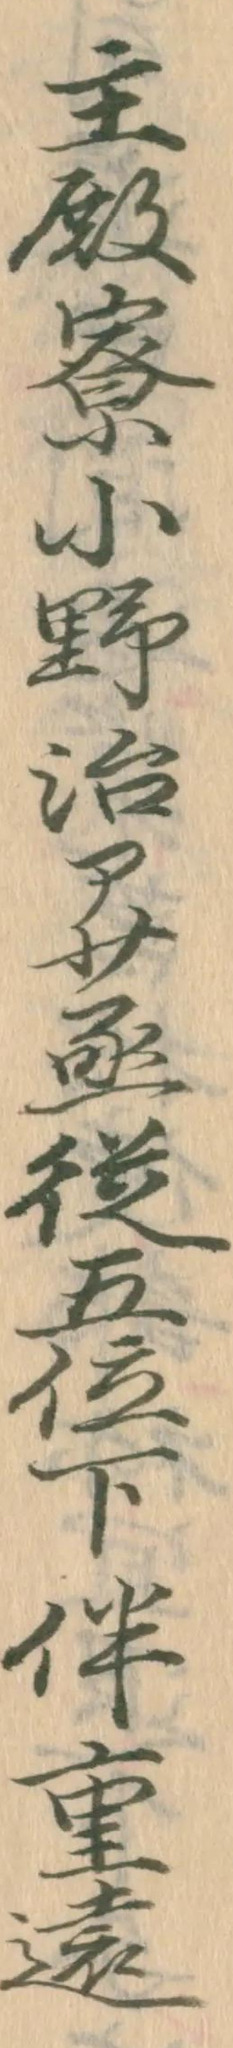主殿寮小野治部少丞従五位下伴重遠
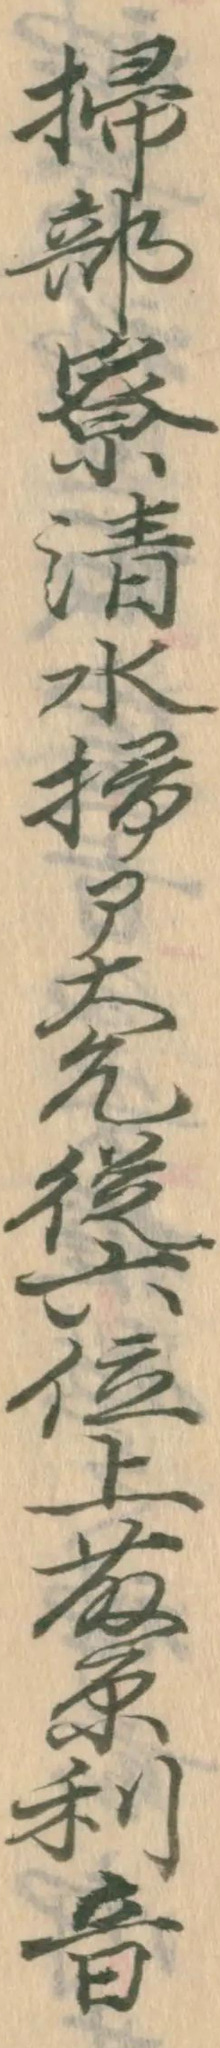掃部寮清水掃部大允従六位上藤原利音
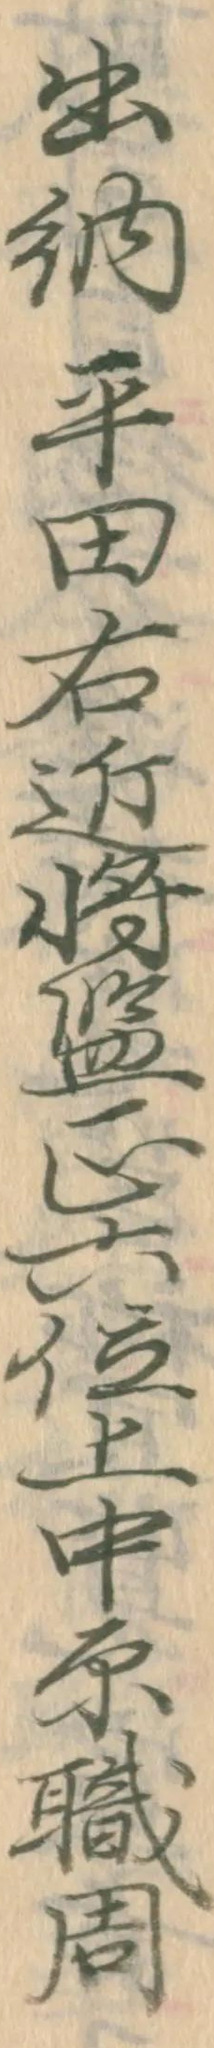出納平田右近将監正六位上中原職周
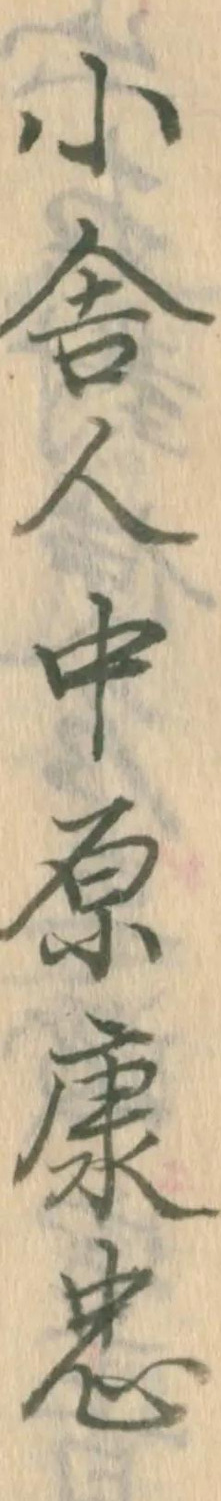小舎人中原康忠
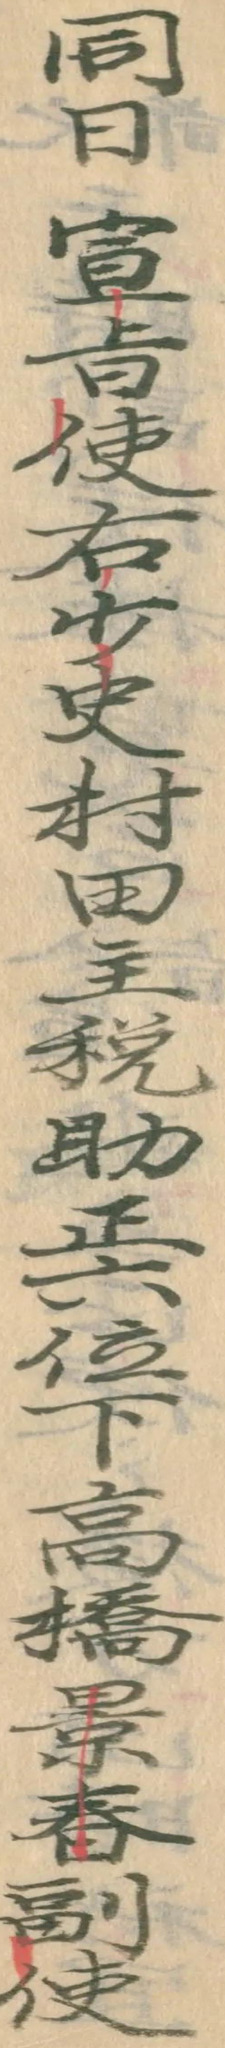同日宣-旨_使右-少-史村田主税助正六位下高橋景春副_使
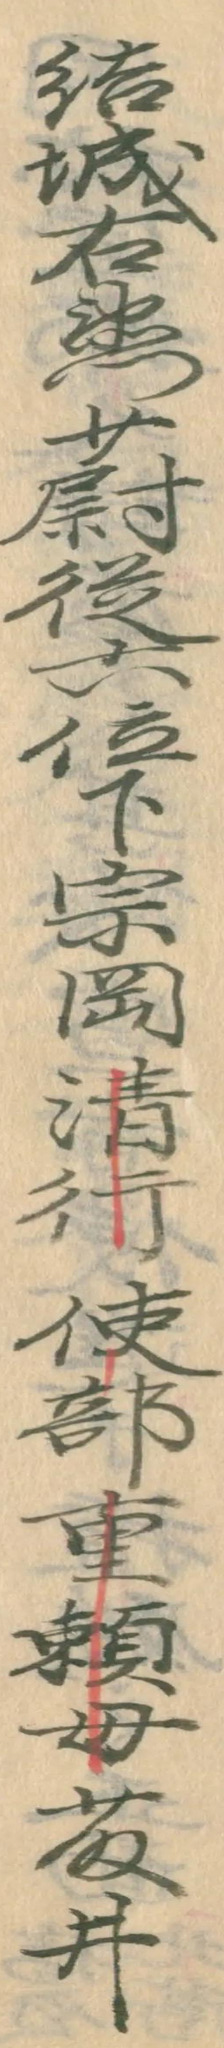結城右衛門少尉従六位下宗岡清行使-部重頼母藤井
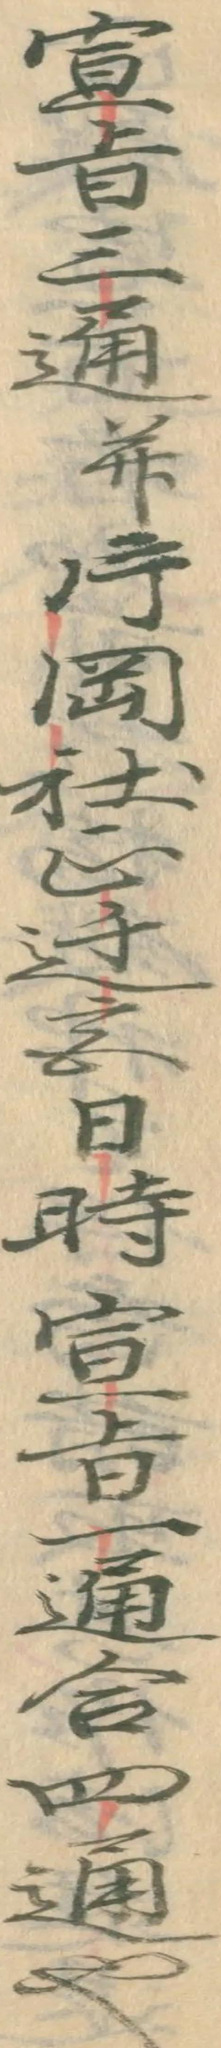宣-旨三-通并片_岡_社正-迁-宮日-時宣-旨一-通合四-通也

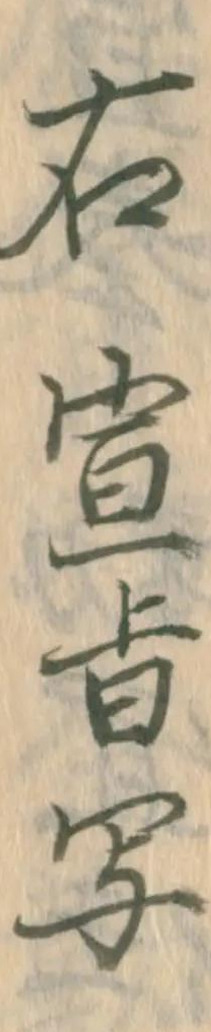右宣旨写
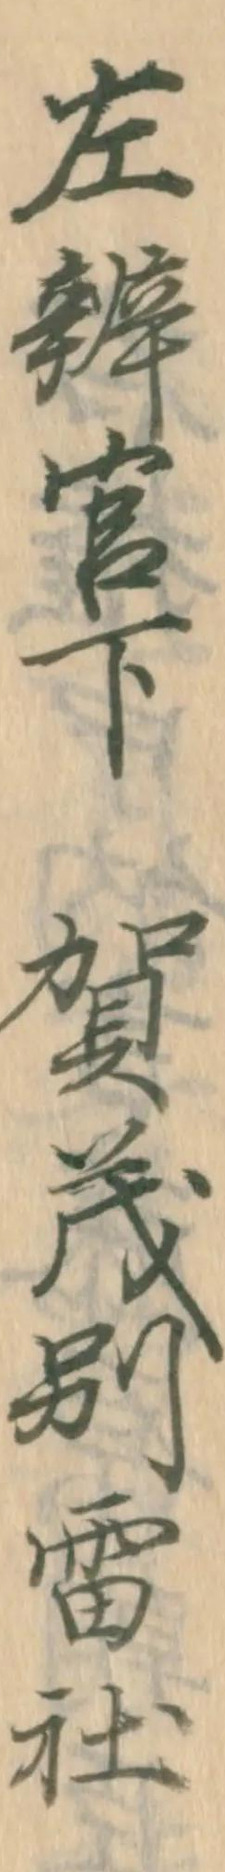左弁官下賀茂別雷社
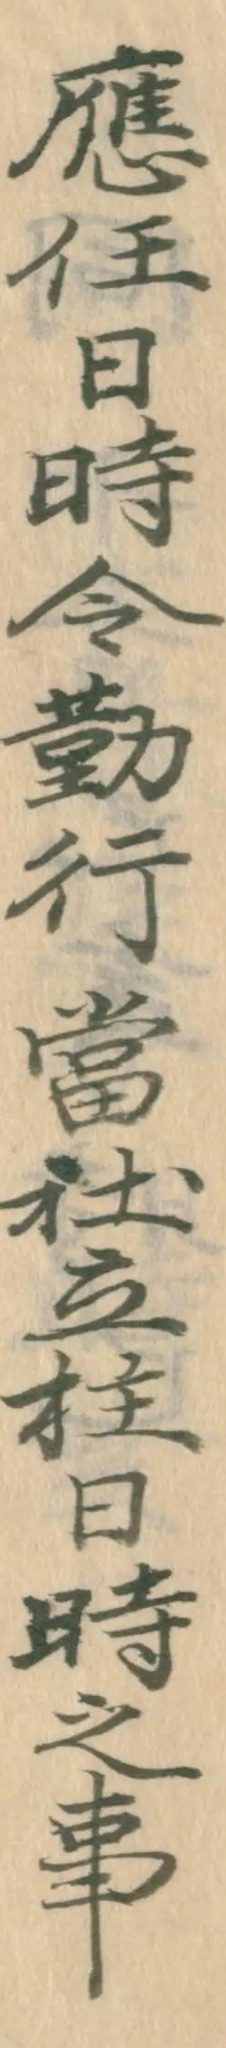応任日時令勤行当社立柱日時之事
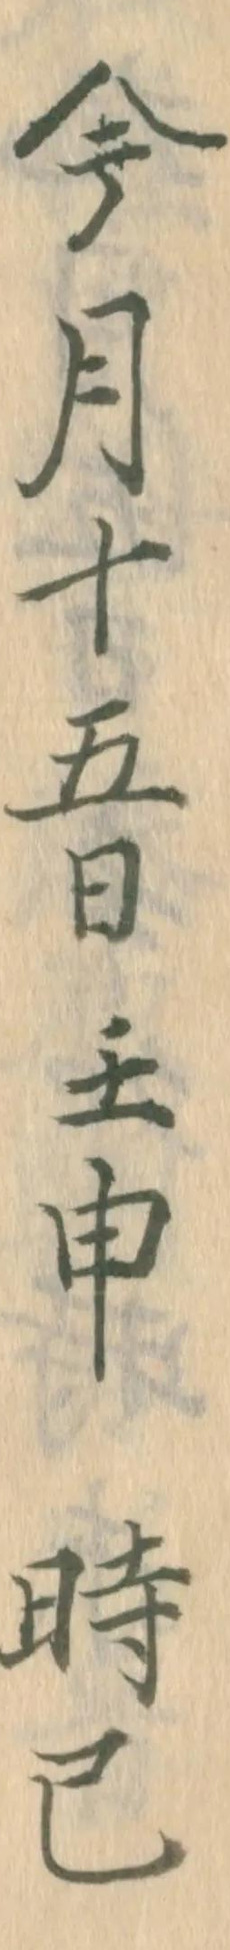今月十五日壬申時巳
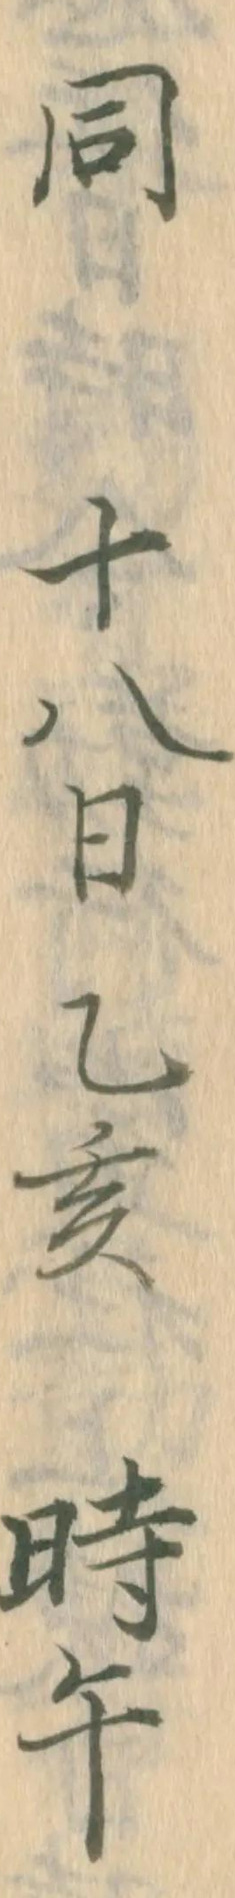同十八日乙亥時午
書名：賀茂社記録. 第16冊
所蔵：国立国会図書館 National Diet Library, JAPAN
